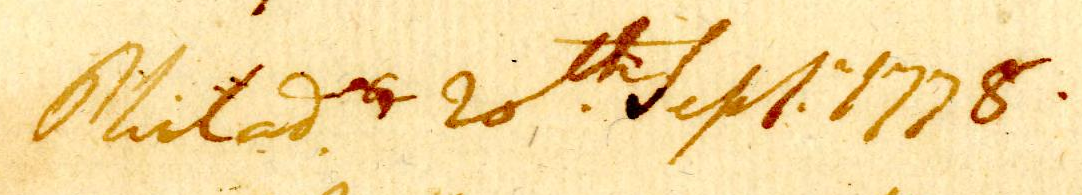Philad^a 20^th. Sept. 1778.
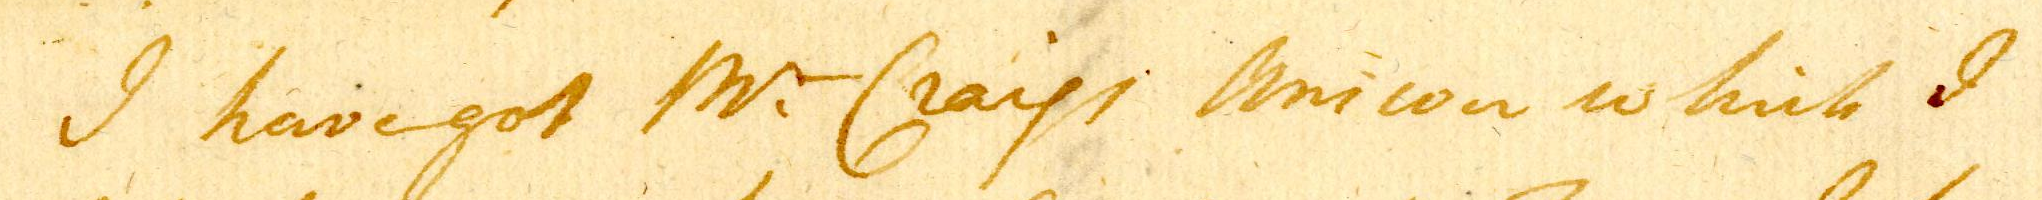I have got M^r. Craigs Answer which I
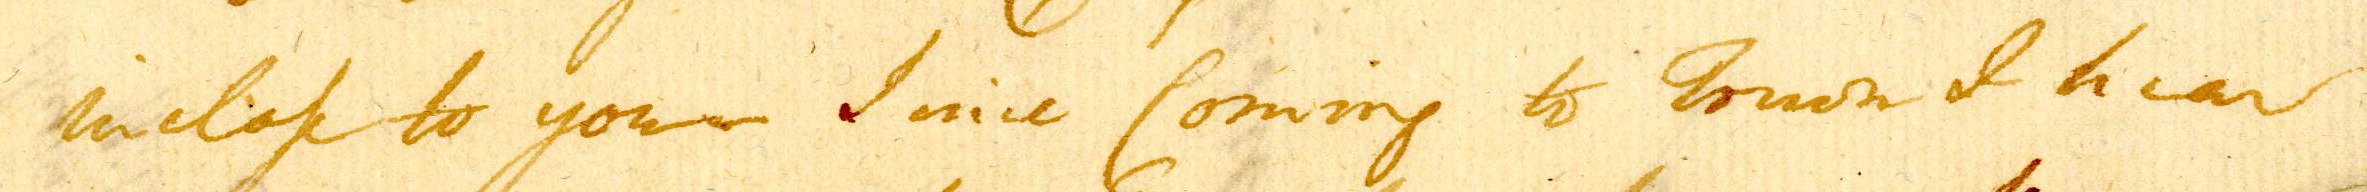inclose to you Since Coming to Town I hear
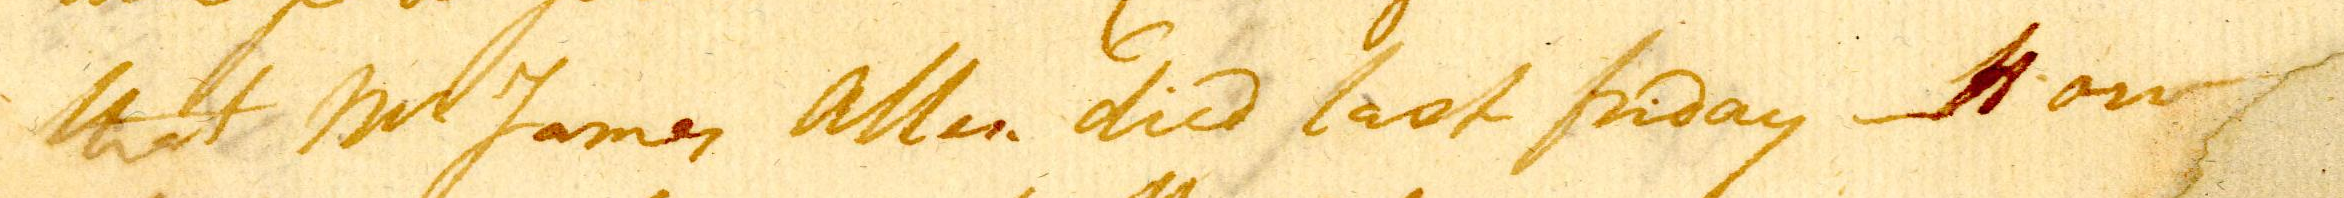that M^r James Allen died last friday. How
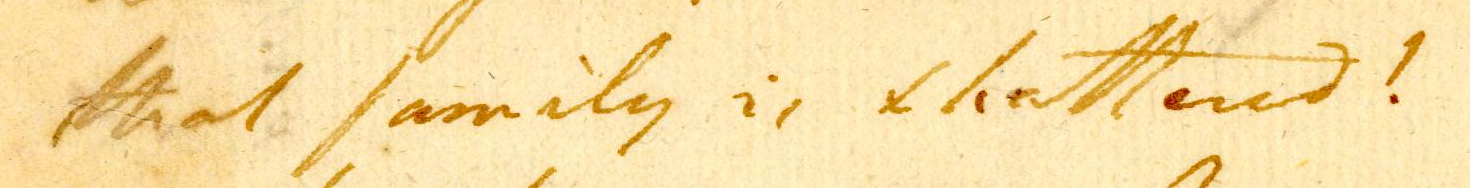that family is Shattered!
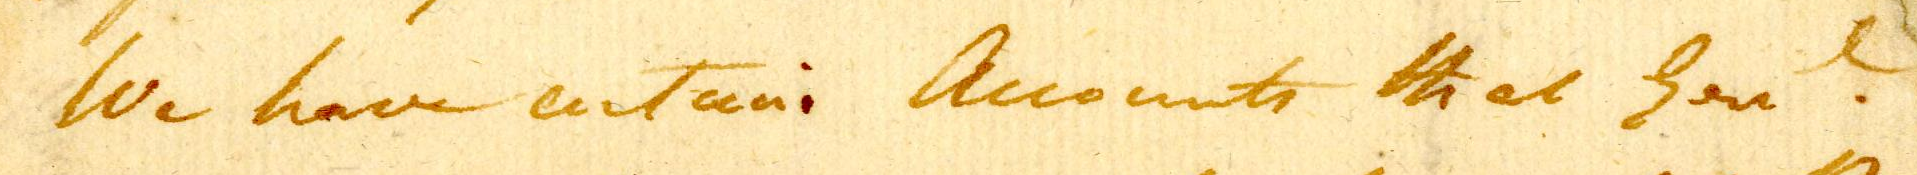We have certain Accounts that Gen^l
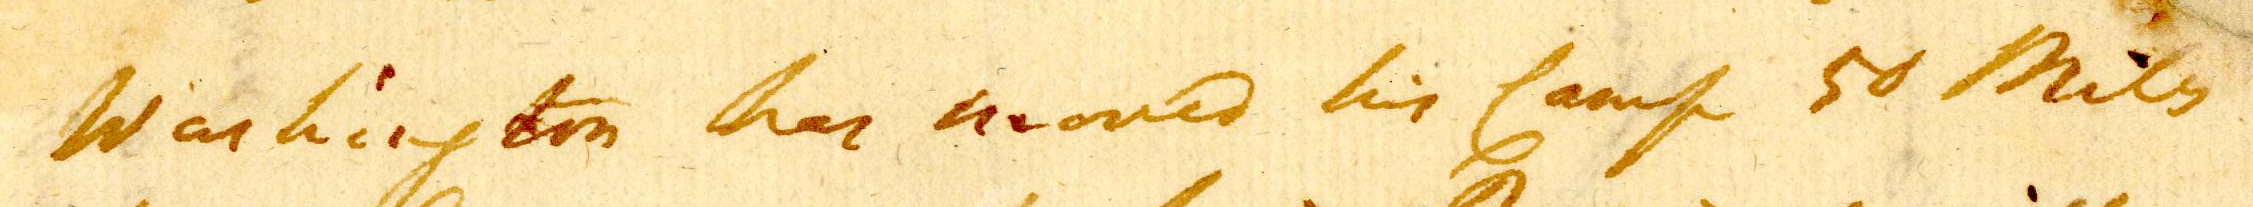Washington has moved his Camp 50 Miles
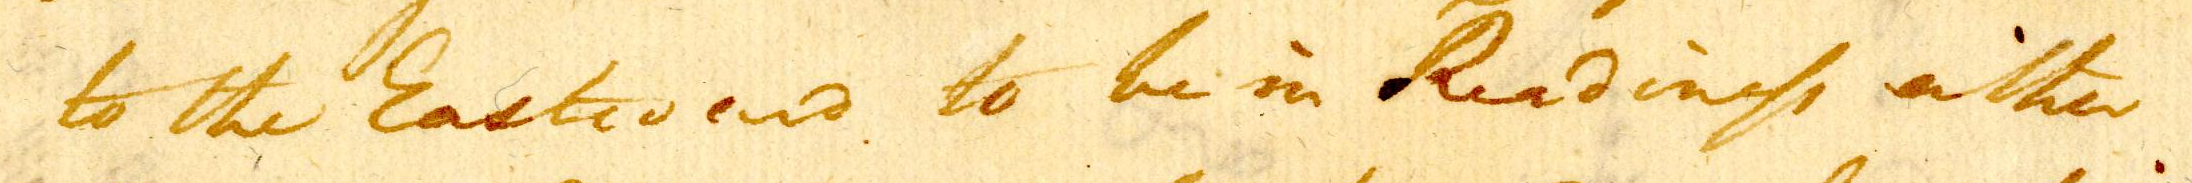to the Eastern end to be in Readiness either
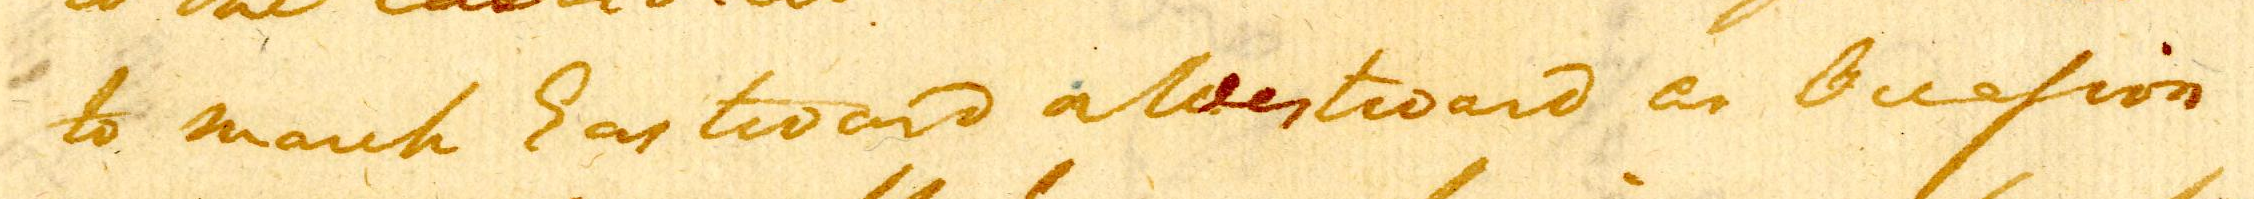to march Eastward or Westward as Occasion
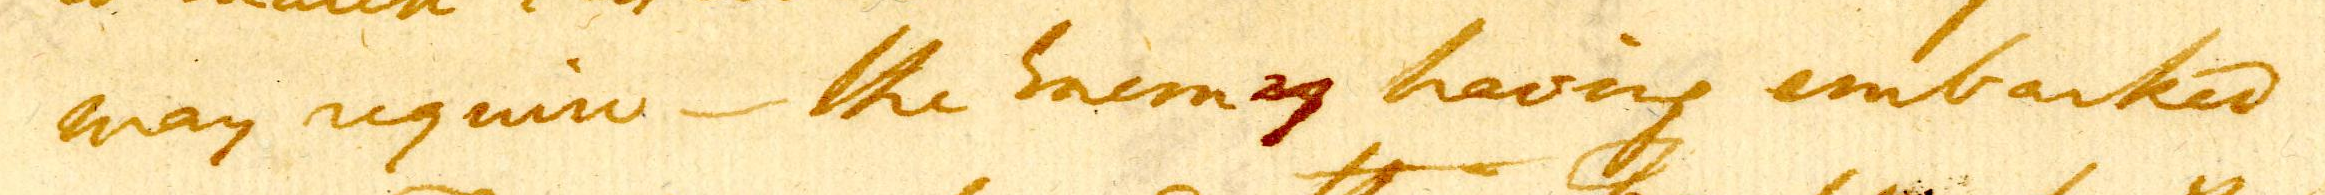may require. the Enemy having embarked
